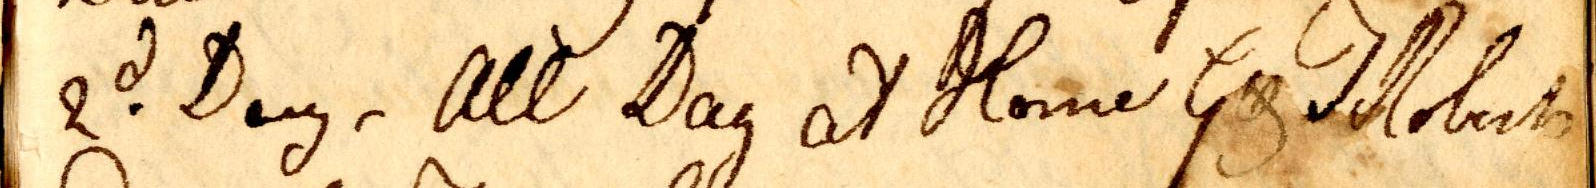2^d Day- All Day at Home G & T Roberts
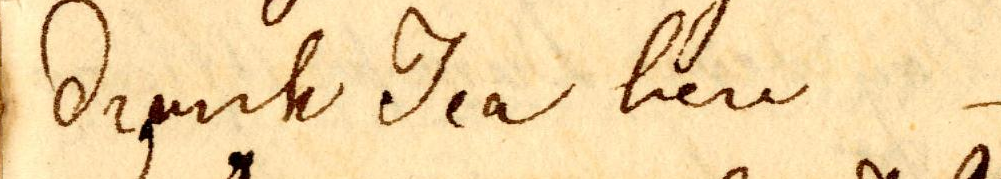drank Tea here
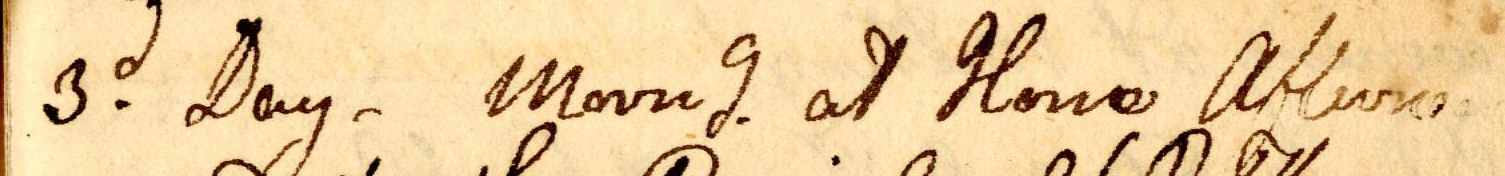3^d Day- Morn^g. at Home Afterno
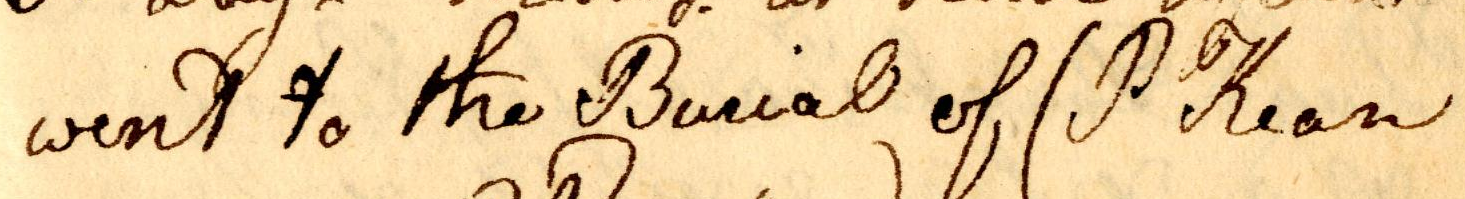went to the Burial of (P Kean
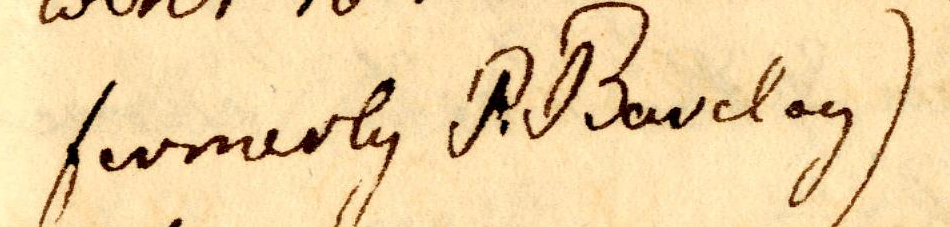formerly P. Barclay)
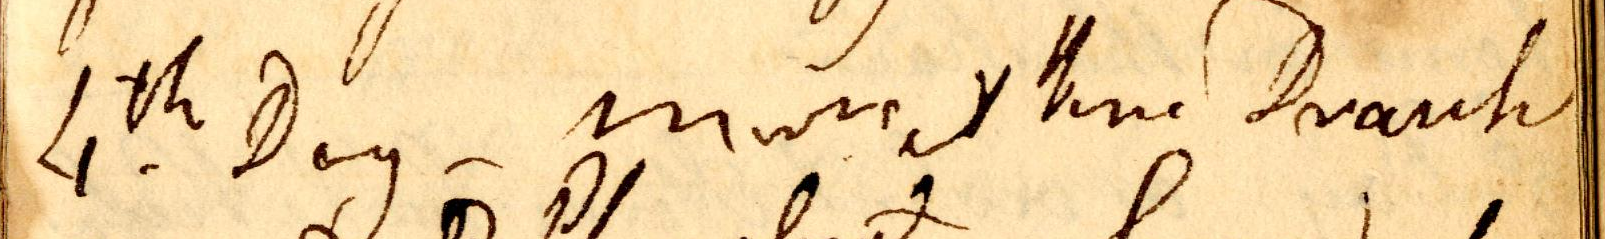4^th Day- [morn y time] Drank
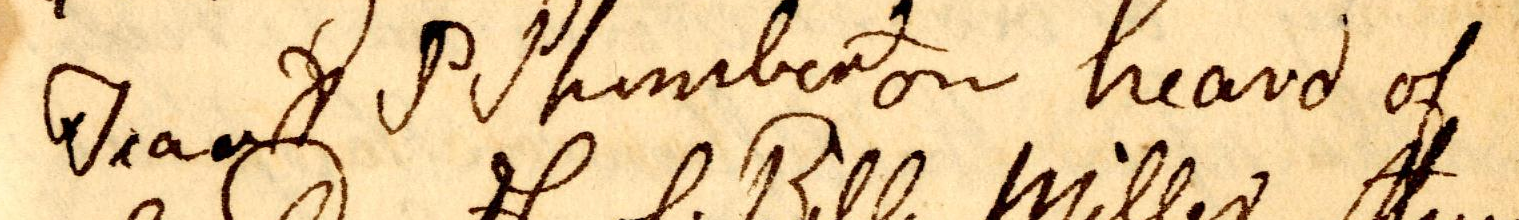Tea at P Plumberton heard of
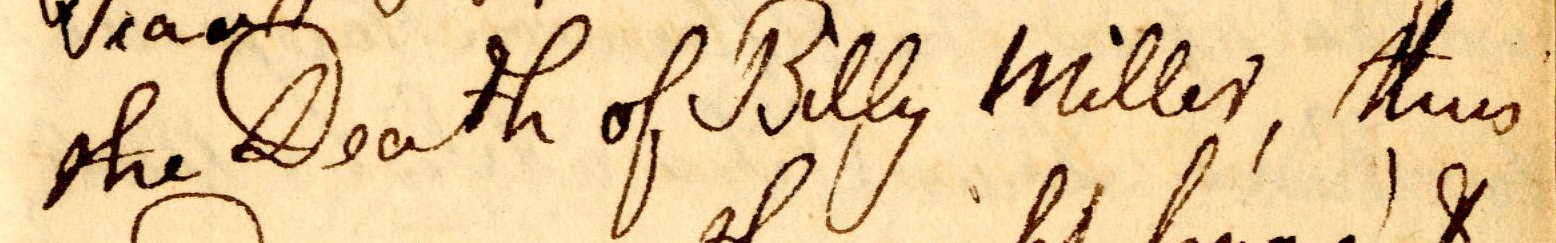the Death of Billy Miller, thus
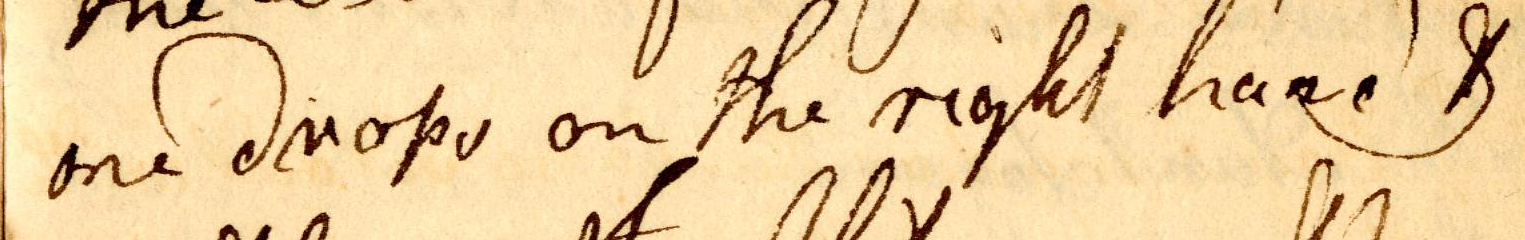one drops on the rights hand &
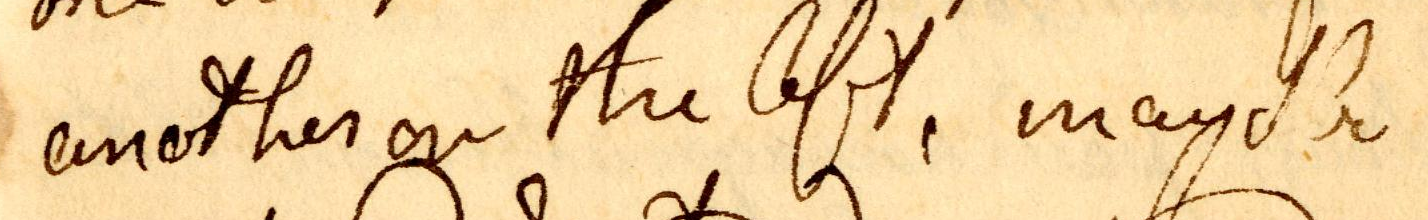another on the left, may I be
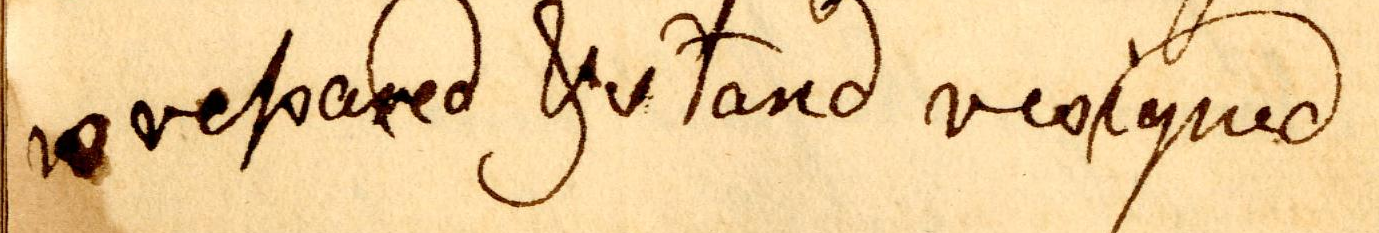prepared & stand resigned
